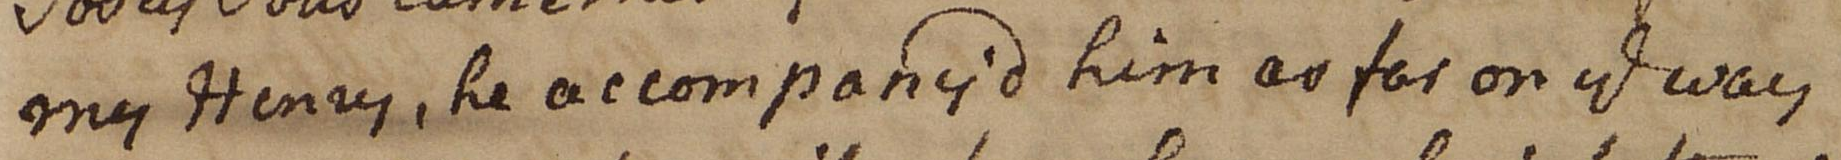my Henry, he accompany'd him as for on y^e way
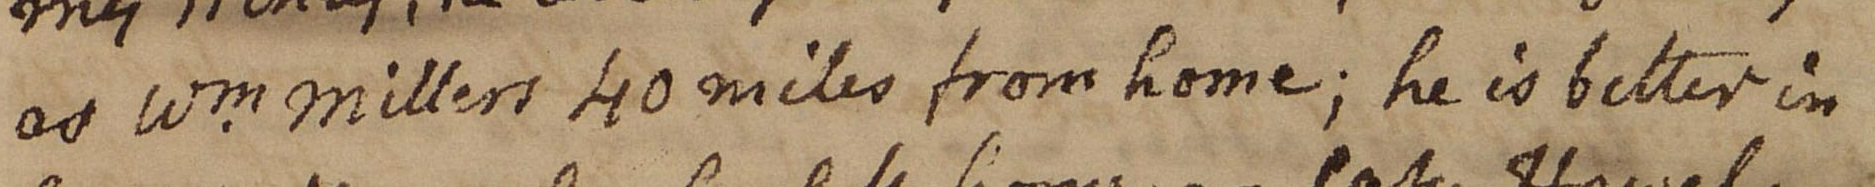as W^m. Millers 40 miles from home; he is better in
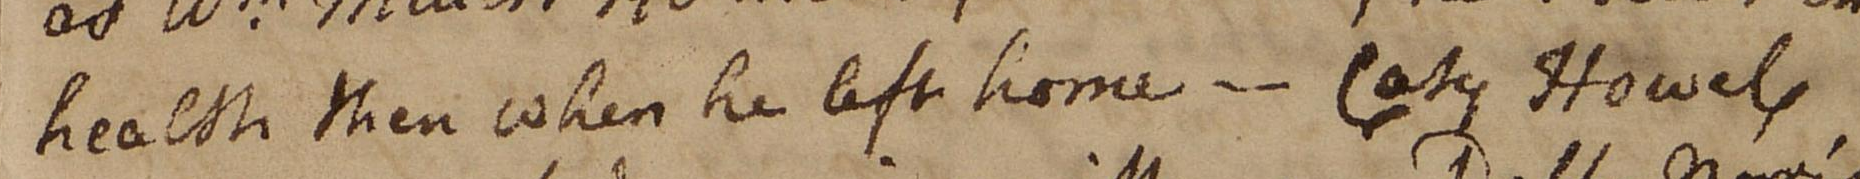health then when he left home- Caty Howel
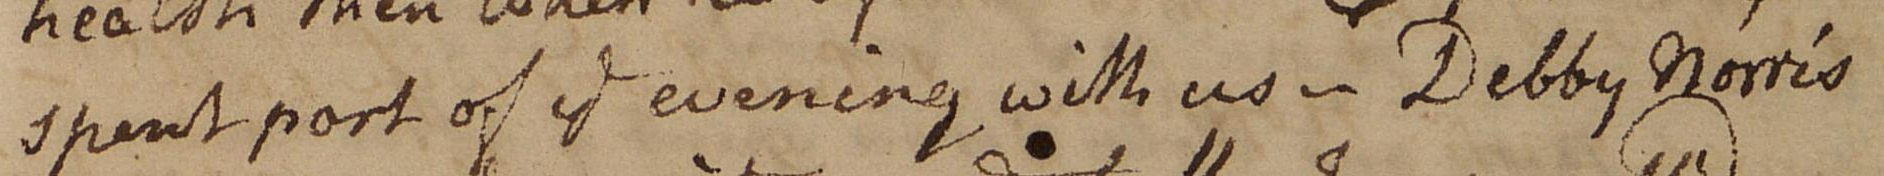spent port of y^e evening with us- Debby Norris
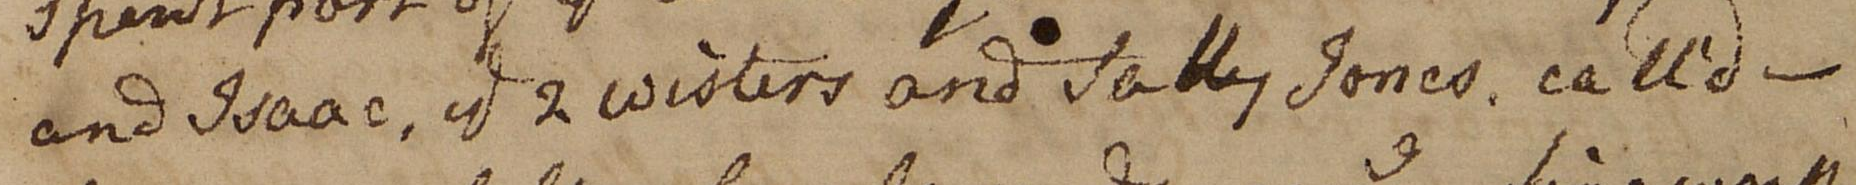and Isaac, y^e 2 Wisters and Sally Jones, call'd
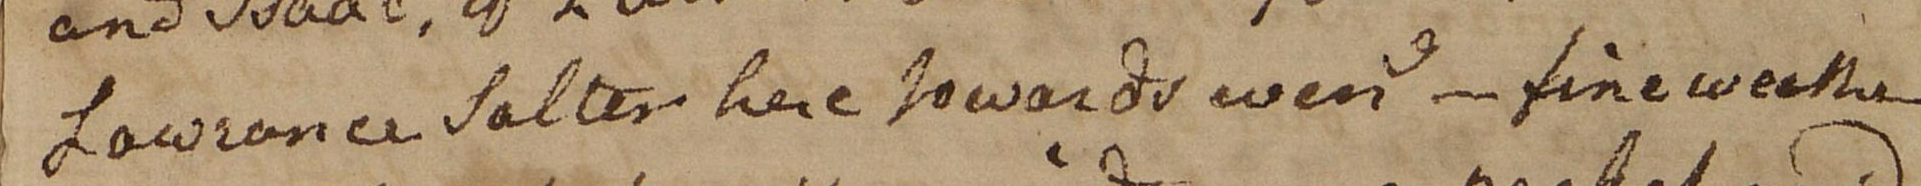Lawrance Salter here towards even^g- fine weathr
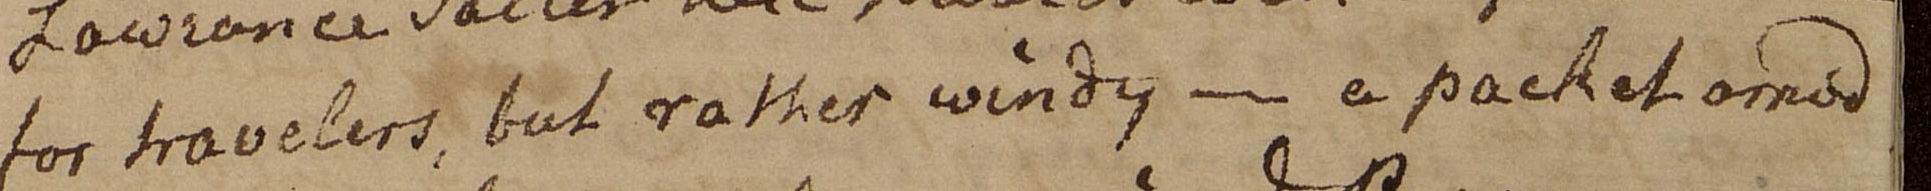for travelers, but rather windy - a packet arriv'd
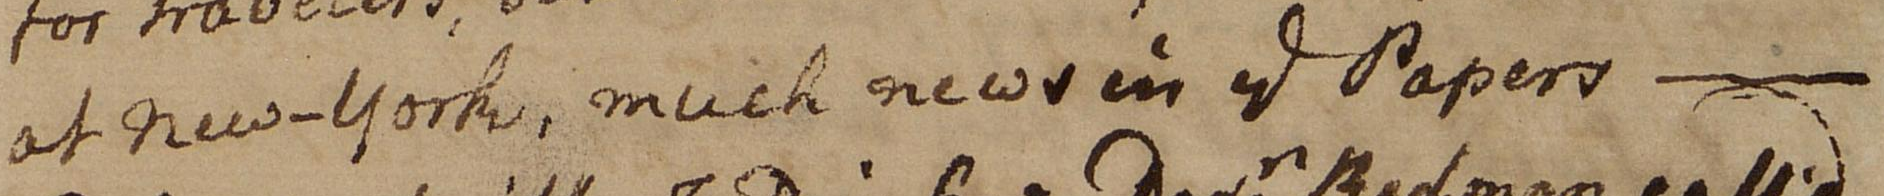at New-York, much news in y^e Papers-
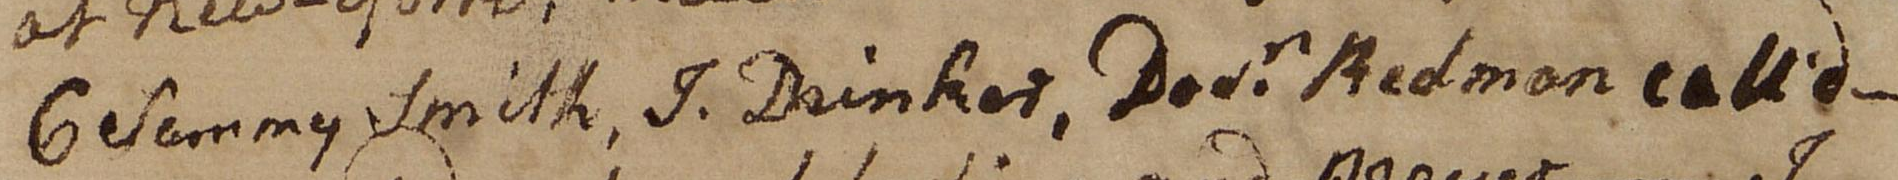6 Sammy Smith, I. Drinker, Doc^r. Redmen call'd-
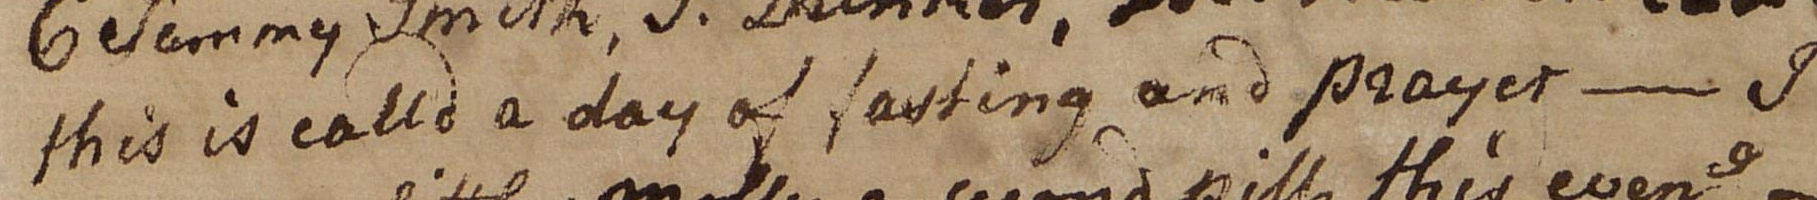this is call'd a day of fasting and prayer- I
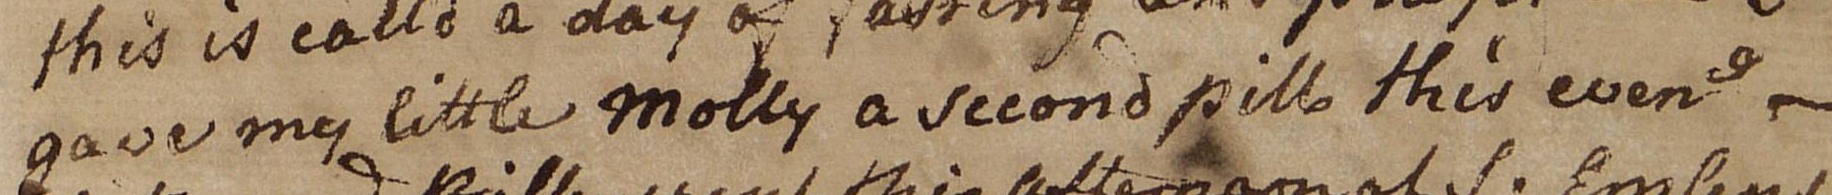gave my little Molly a second pill this even^g-
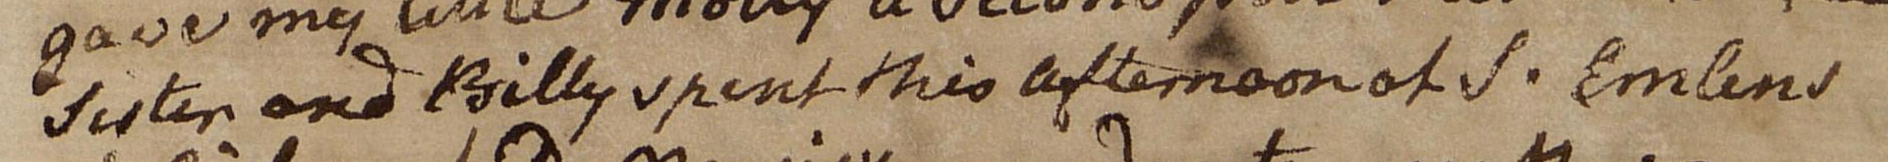Sister and Billy spent this Afternoon at S. Emlens
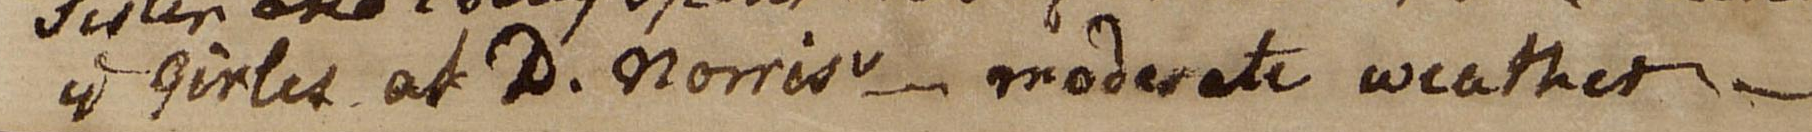y^e Girles at D. Norris^s- moderate weather -
